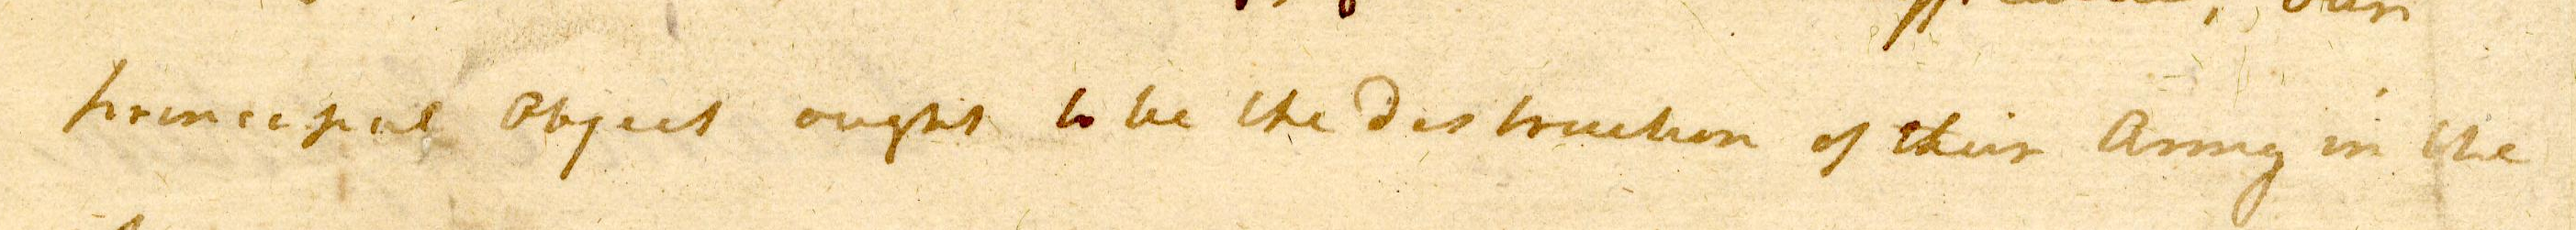principal Object ought to be the destruction of their Army in the
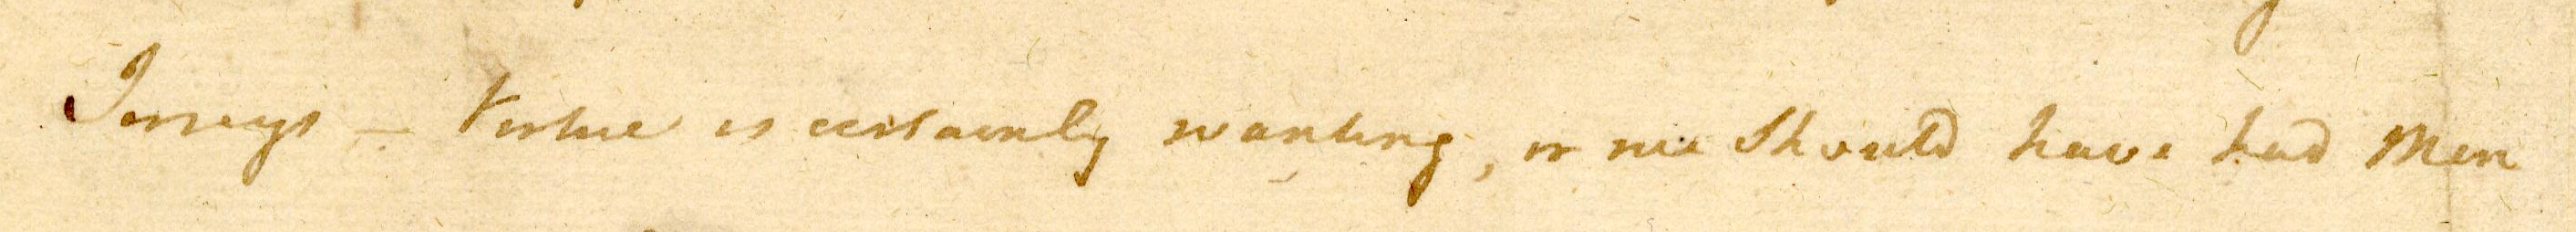Janeys- Virtue is certainly wanting, if we should have had men
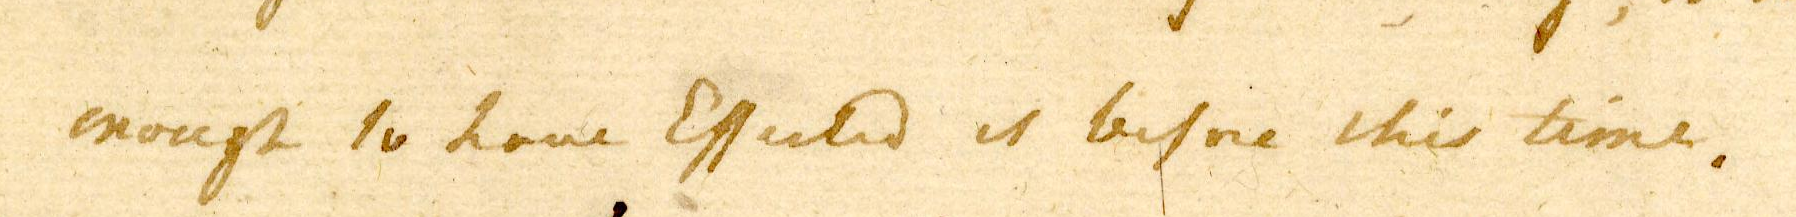enough to have Effected is before this time,
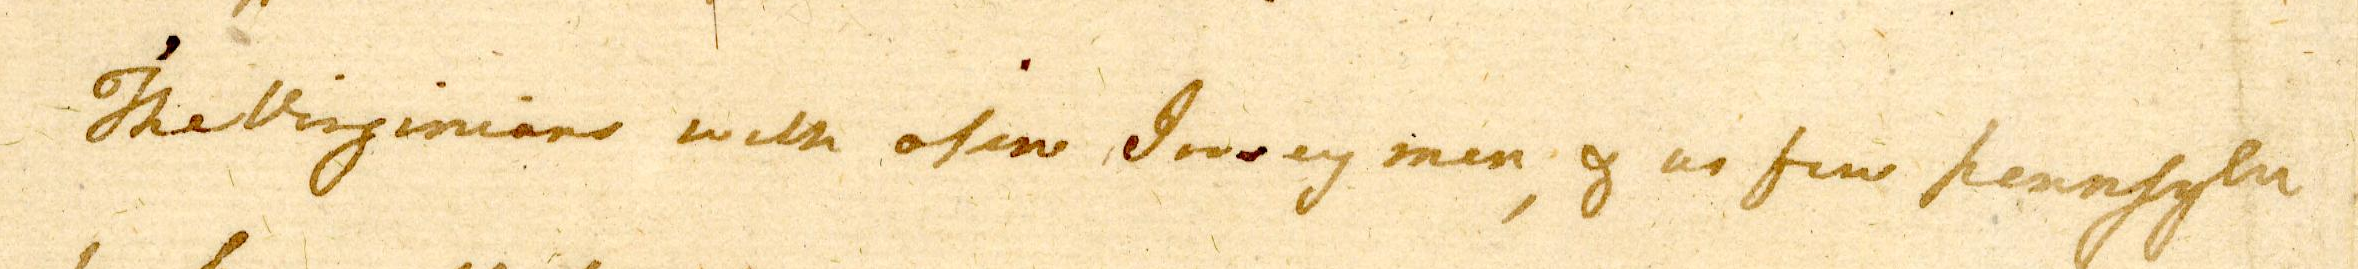The Virginians with a few surrey men, or as few Pennsylvania
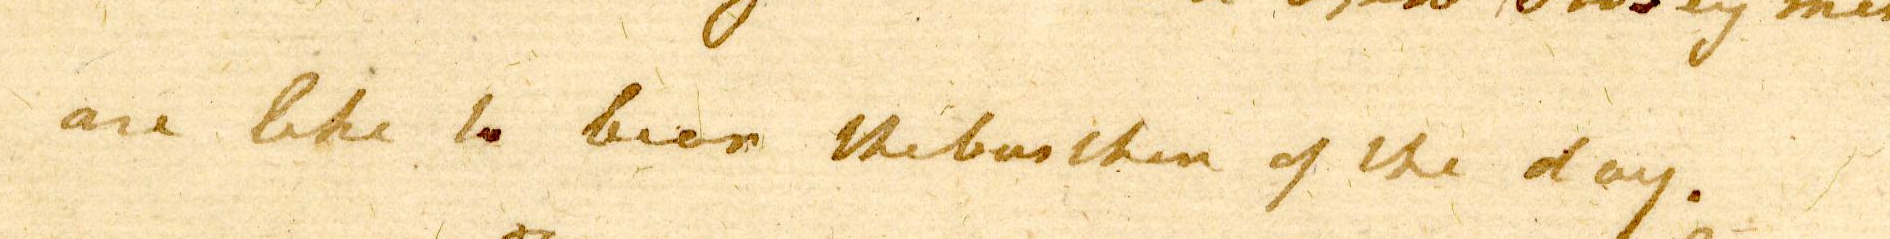are like to been the best then of the day.
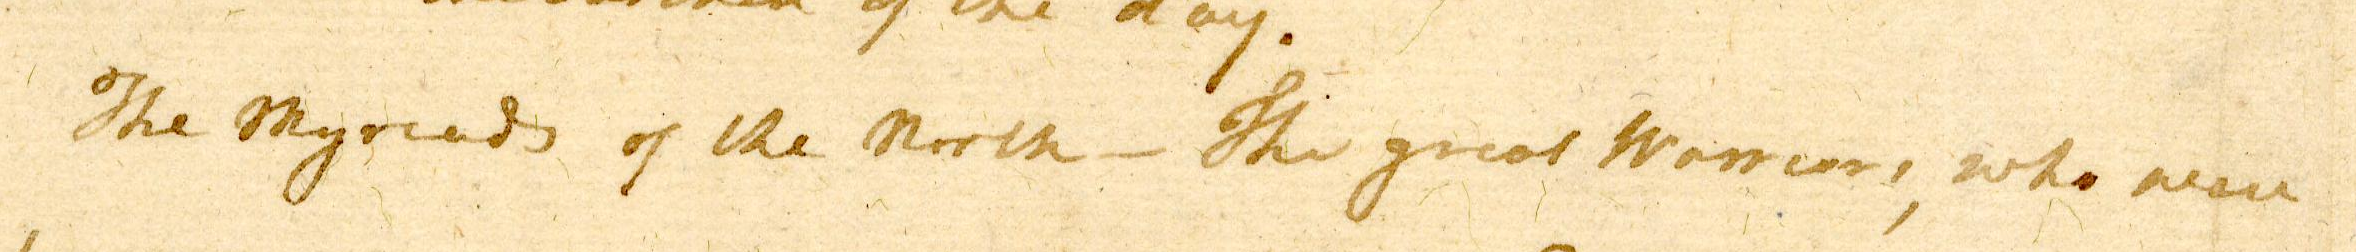The Myreds of the North- The great Warriors who were
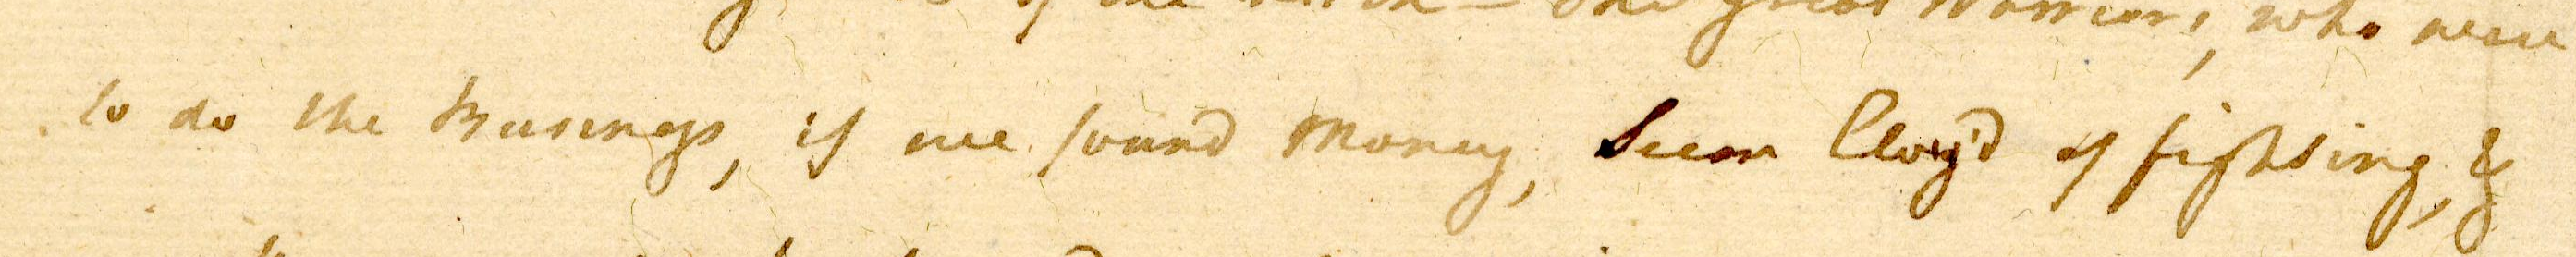to do the Burnings if we found money been Cloy'd of fighting &
